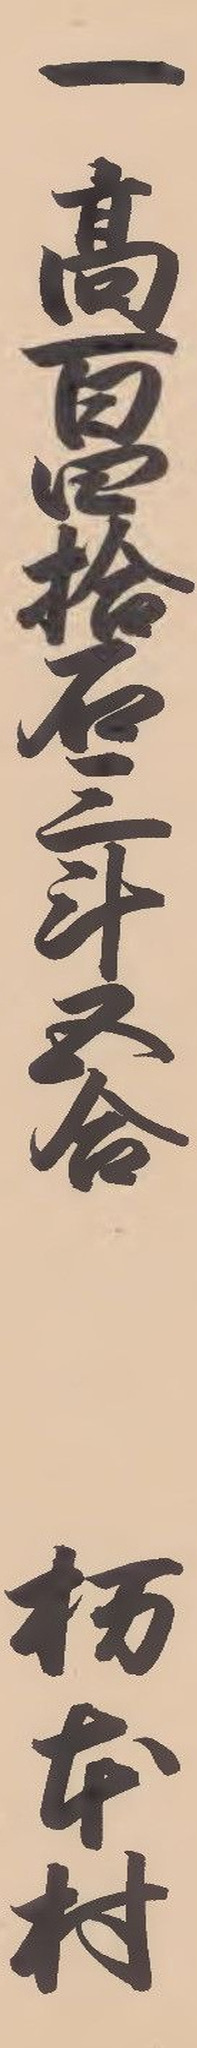一高百四拾石三斗五合栃本村
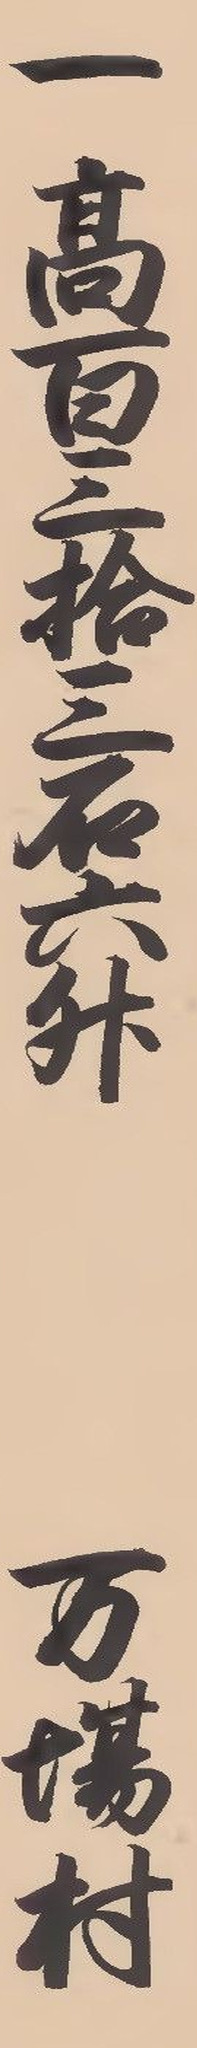一高百三拾三石六升万場村
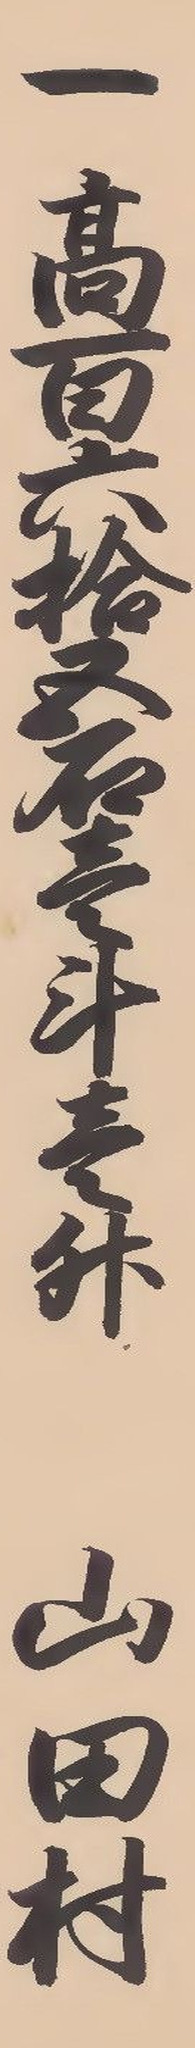一高百六拾五石壱斗壱升山田村
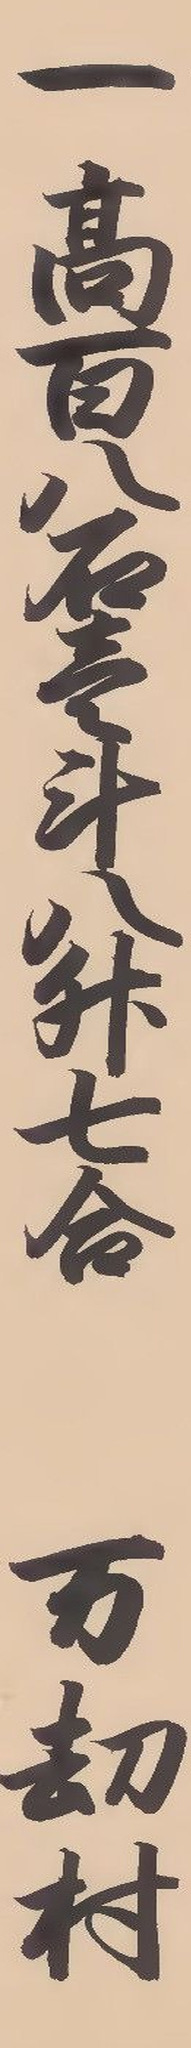一高百八石壱斗八升七合万刧村
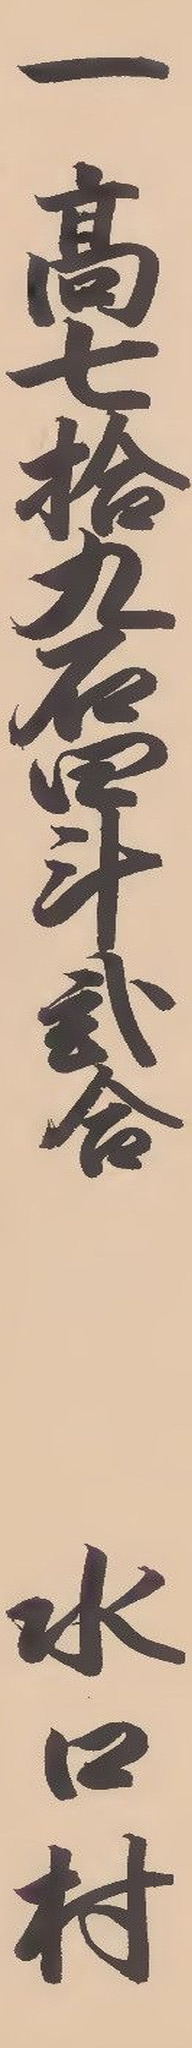一高七拾九石四斗弐合水口村

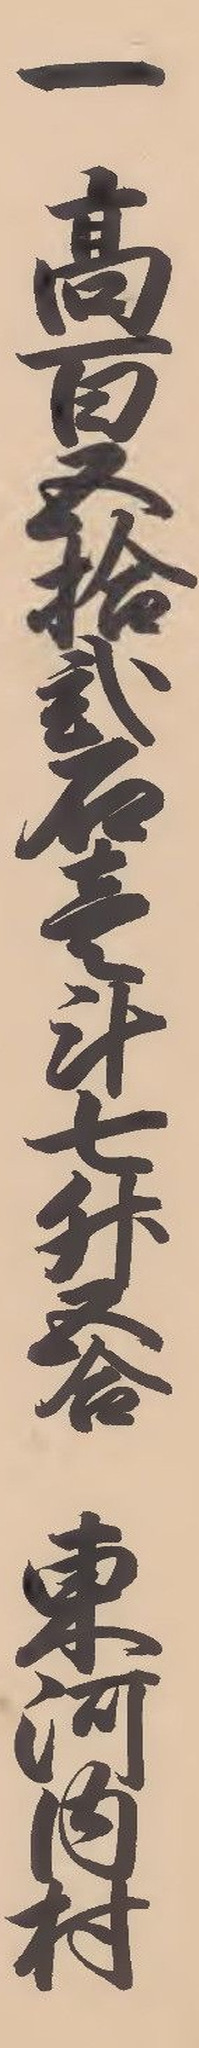一高百五拾弐石壱斗七升五合東河内村
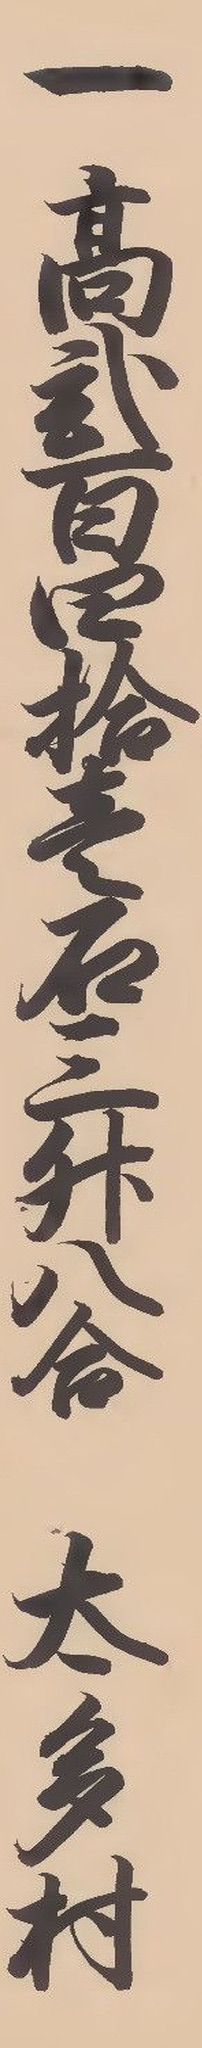一高弐百四拾壱石三升八合太多村
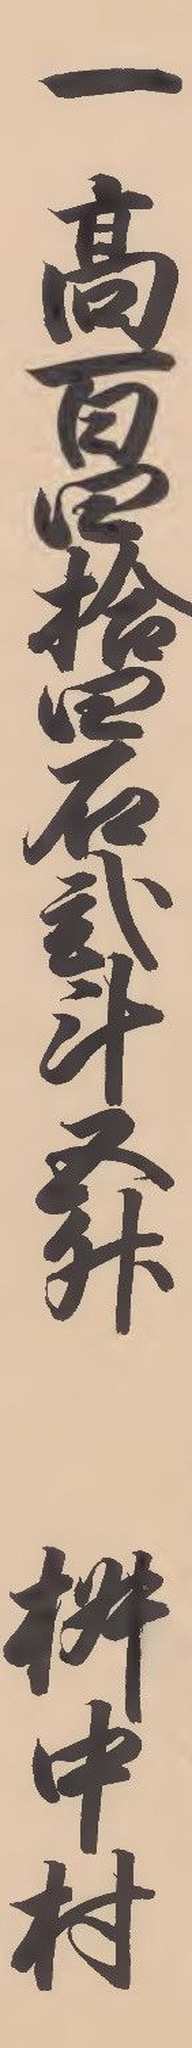一高百四拾四石弐斗五升椒中村
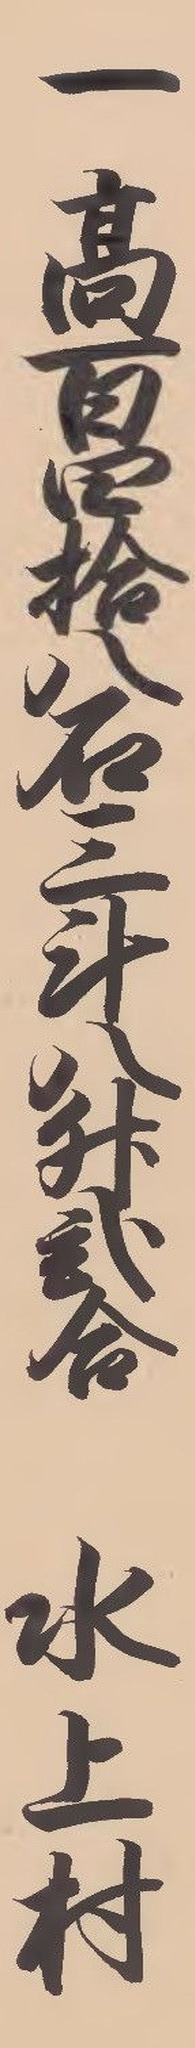一高百四拾八石三斗八升弐合水上村
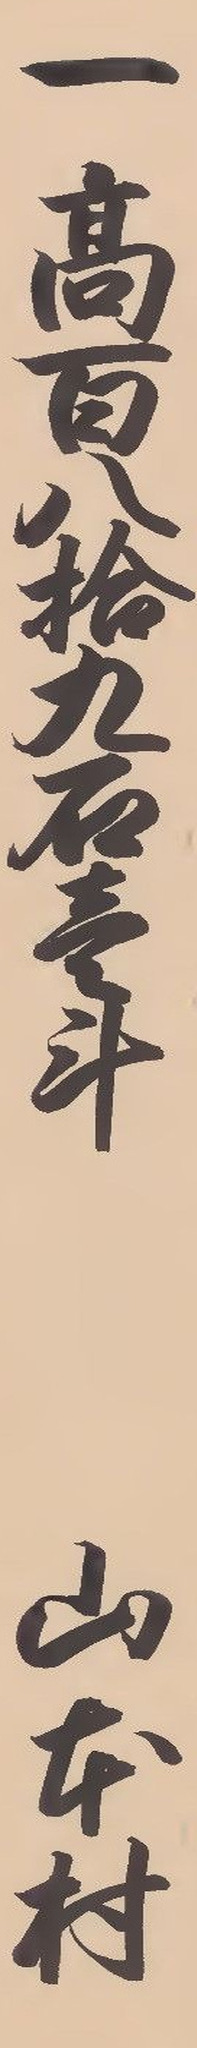一高百八拾九石壱斗山本村
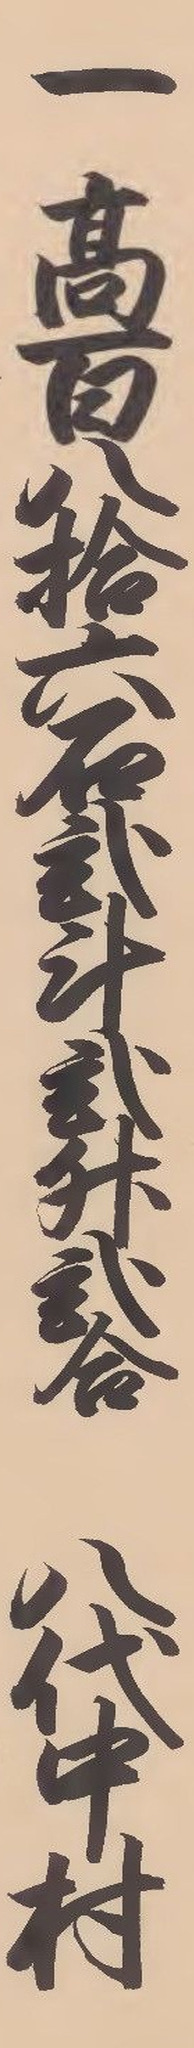一高百八拾六石弐斗弐升弐合八代中村
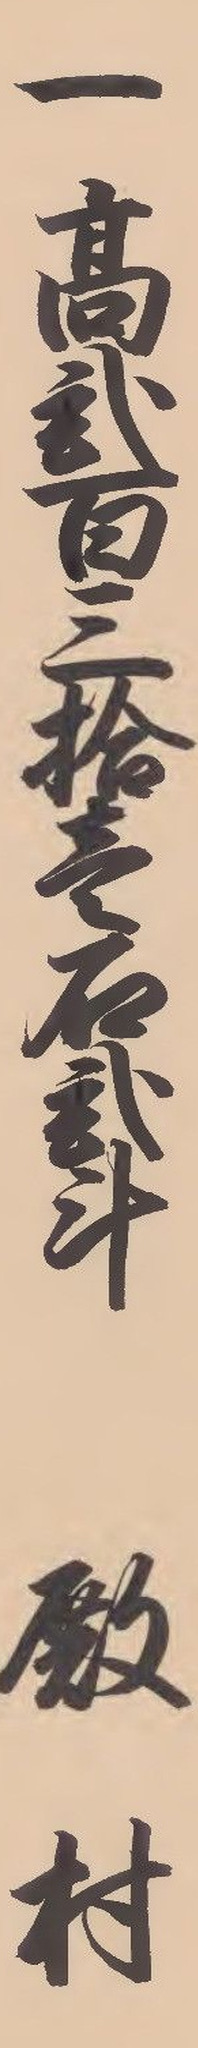一高弐百三拾壱石弐斗殿村
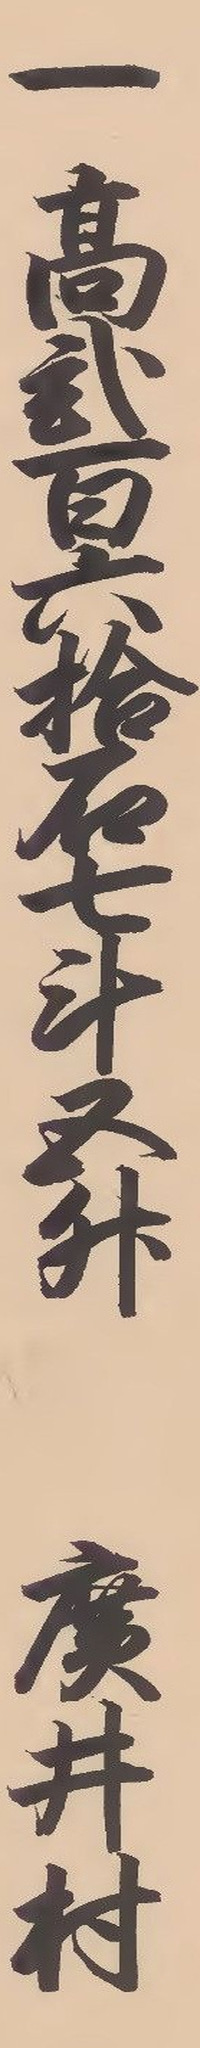一高弐百六拾石七斗五升広井村

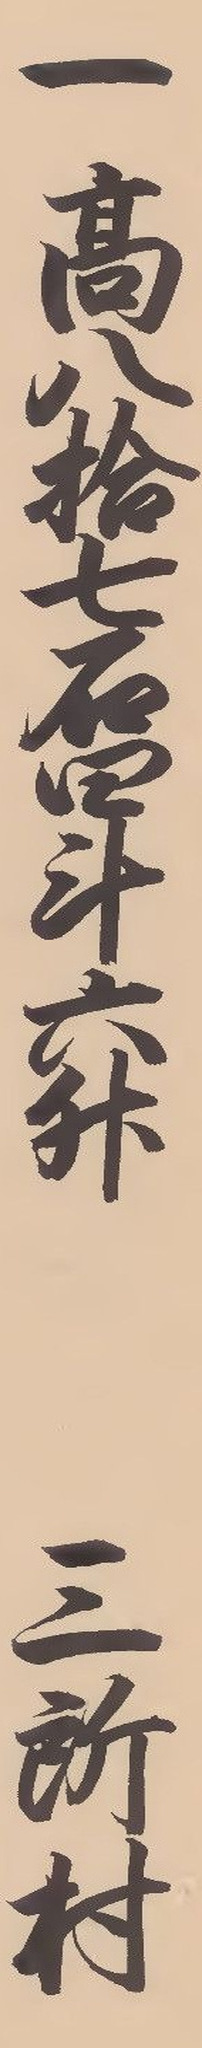一高八拾七石四斗六升三所村
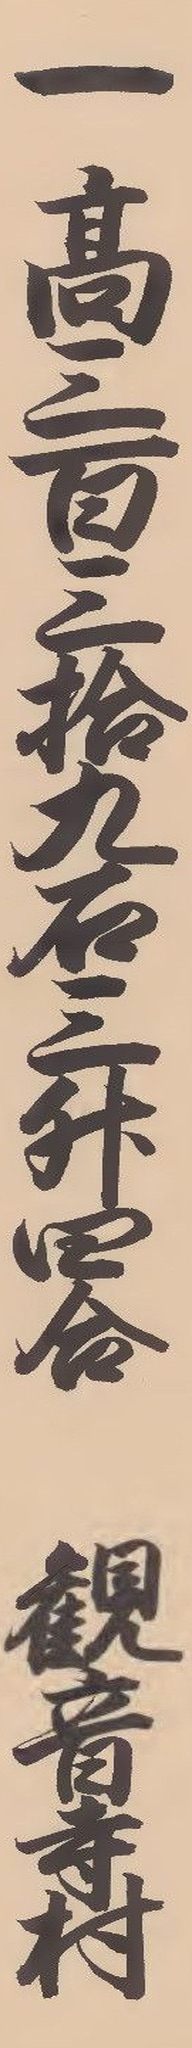一高三百三拾九石三升四合観音寺村
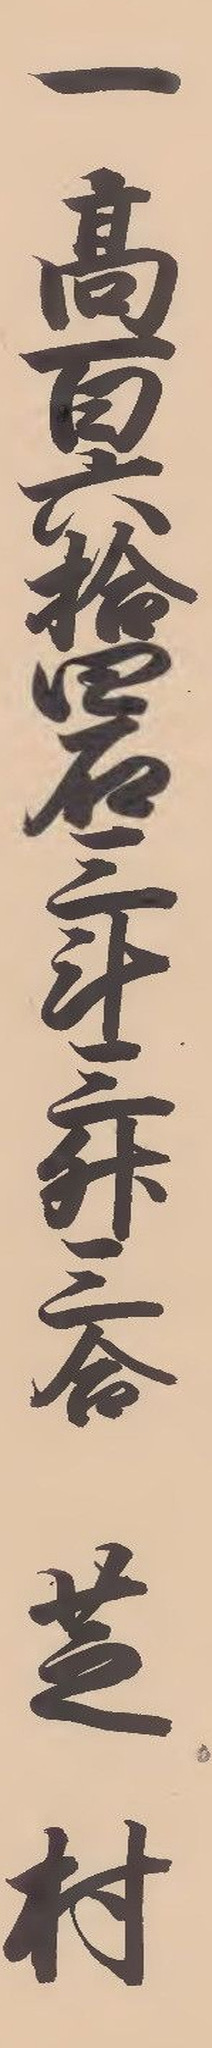一高百六拾四石三斗三升三合芝村
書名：但馬国郷帳
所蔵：国立公文書館 National Archives of Japan
